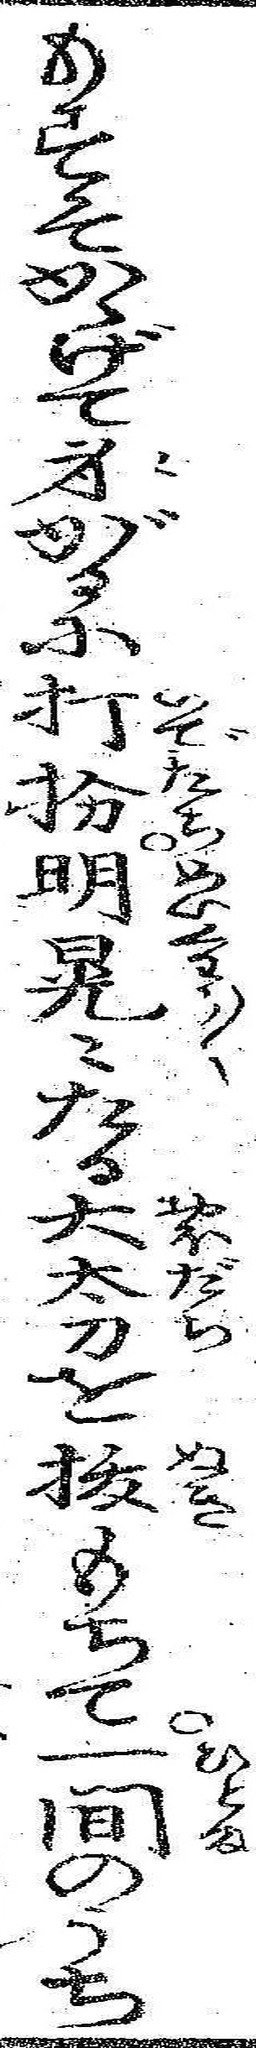もすそかゝげて身がるに打扮。明晃々たる大太刀を抜もちて。一間のうち
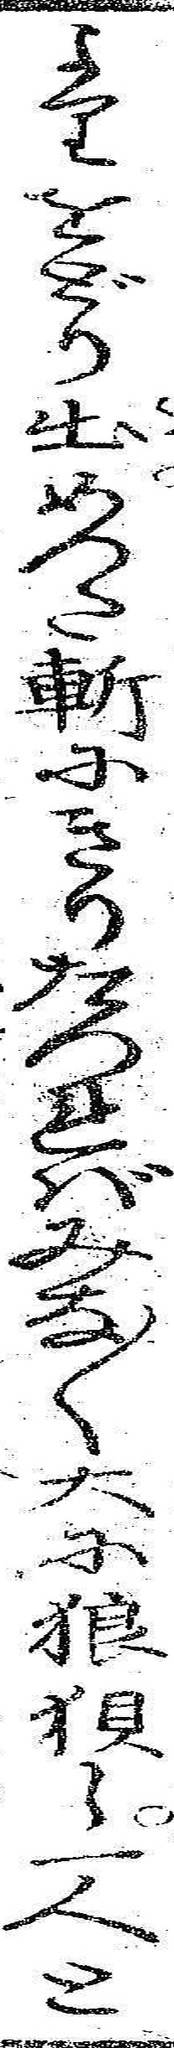よりをどり出。めつた斬にきりたつればみな〳〵大に狼狽し。一人と
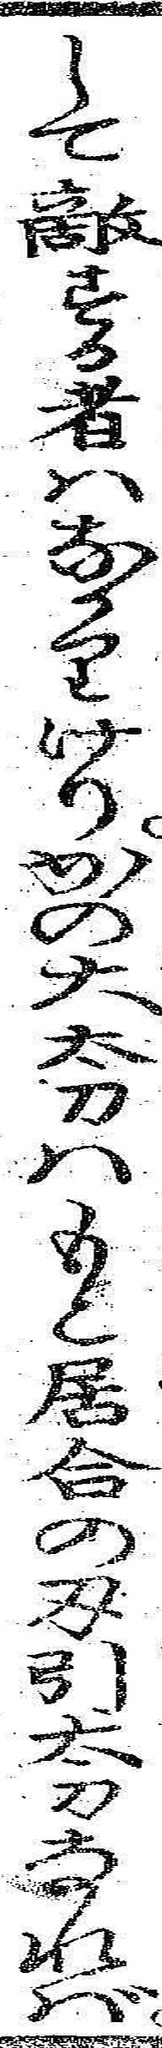して敵する者はなかりけり。かの大太刀はもと居合の刃引太刀なれば。
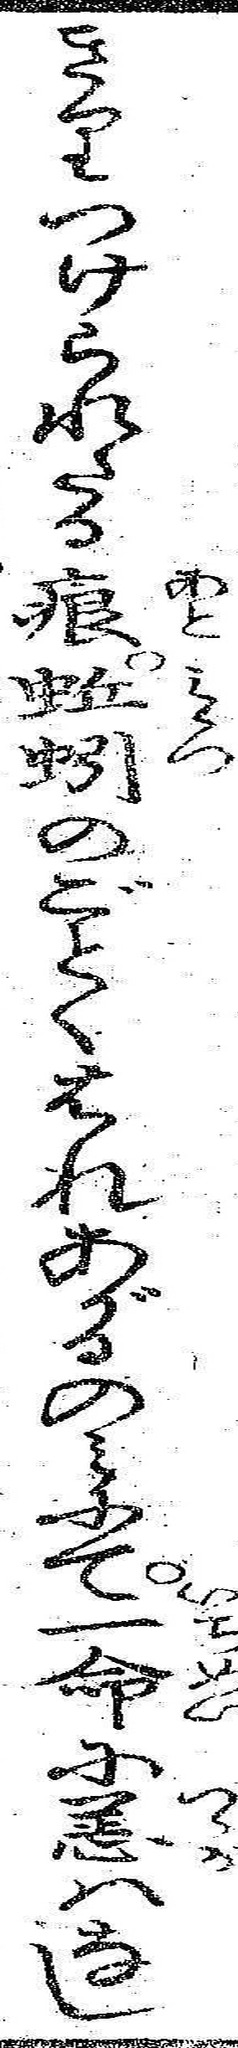きりつけられたる痕。蚯蚓のごとくはれあがるのみにて。一命に恙はなし
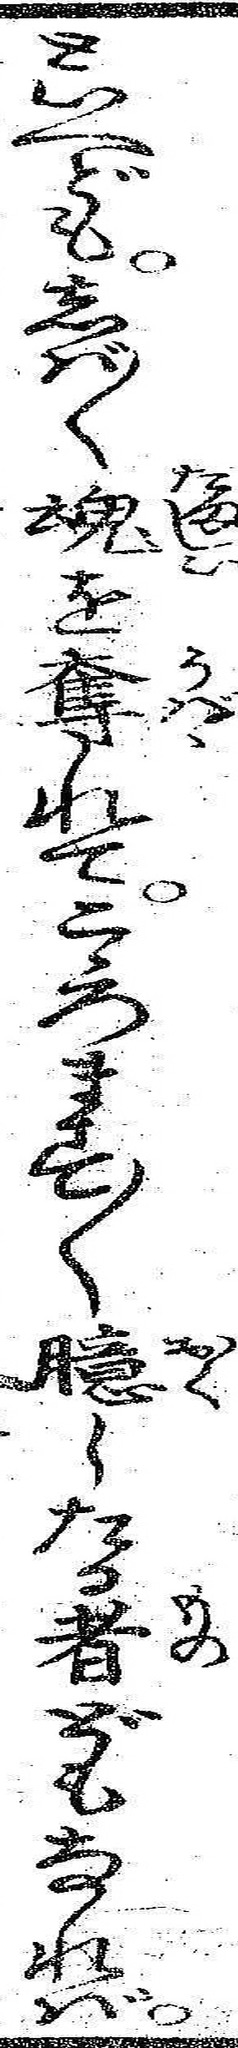といへども。しば〳〵魂を奪れて。こゝろます〳〵臆したる者どもなれば。
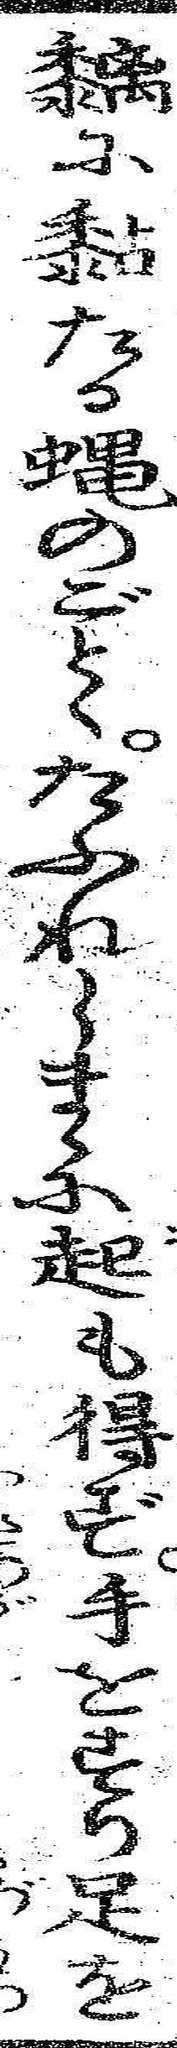黐に黏たる蝿のごとく。たふれしまゝに起も得ず。手をすり足を
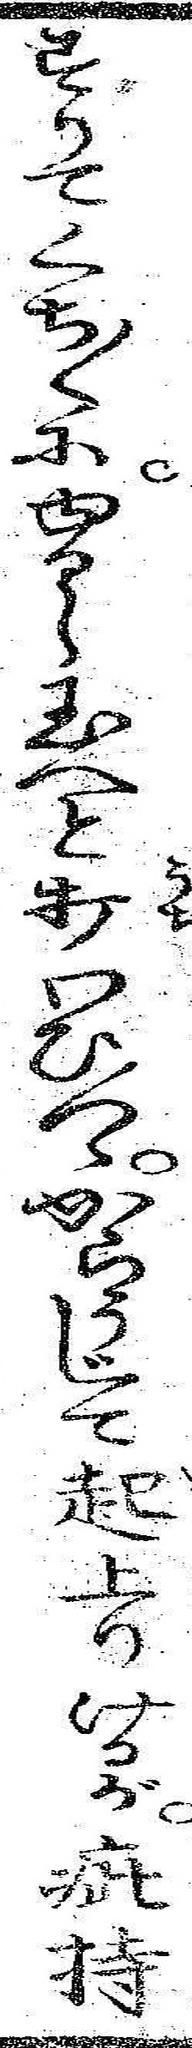すりてくち〳〵に。ゆるし玉へと打わひつゝ。からうじて起上りけるが。疵持

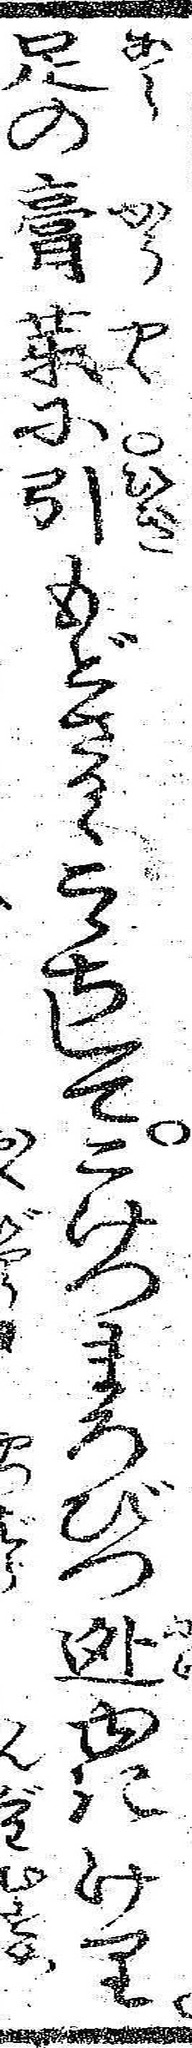足の膏薬に。引もどさるゝこゝちして。こけつまろびつ逃ゆきけり。
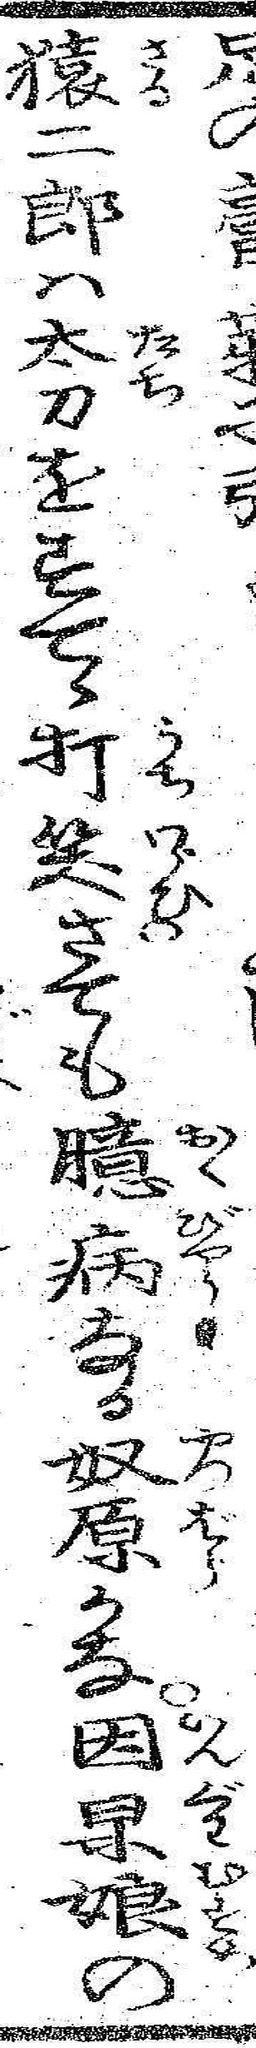猿二郎は太刀をすてゝ打笑。さても臆病なる奴原かな。因果娘の
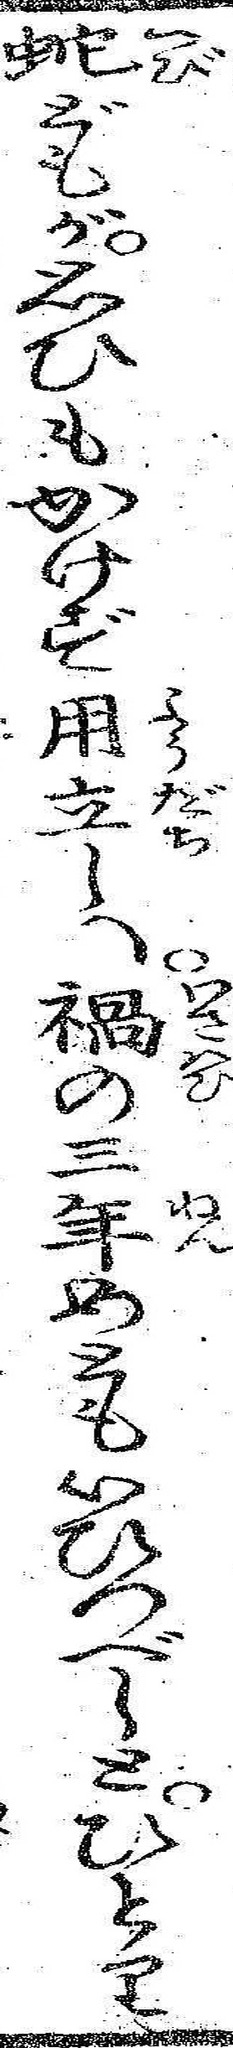蛇どもが。思ひもかけず用立しは。禍の三年めともいひつべしと。ひとり
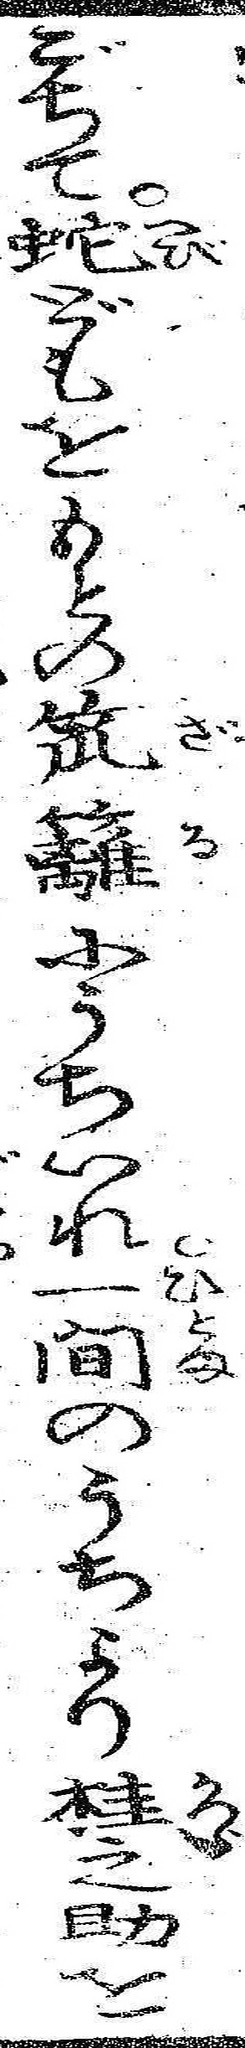ごちて。蛇どもをもとの笊籬にうちいれ。一間のうちより桂之助を
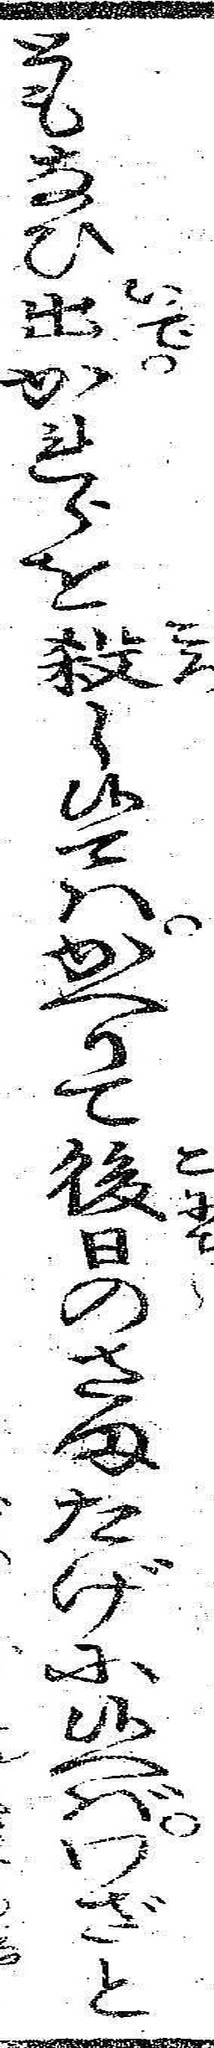ともなひ出。かれらを殺し候ては。かへりて後日のさまたげに候へば。わざと
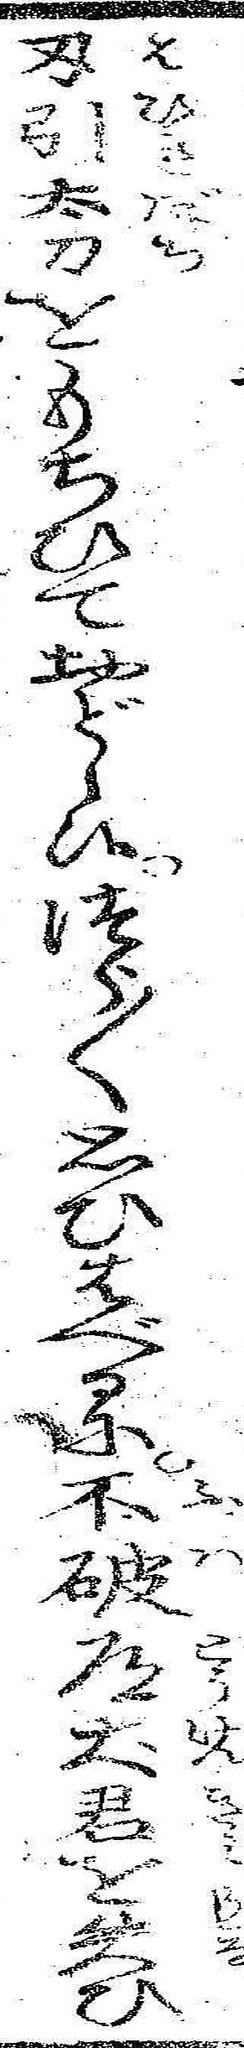刃引太刀をもちひておどし候。つら〳〵思ひはべるに。不破道犬君を失ひ
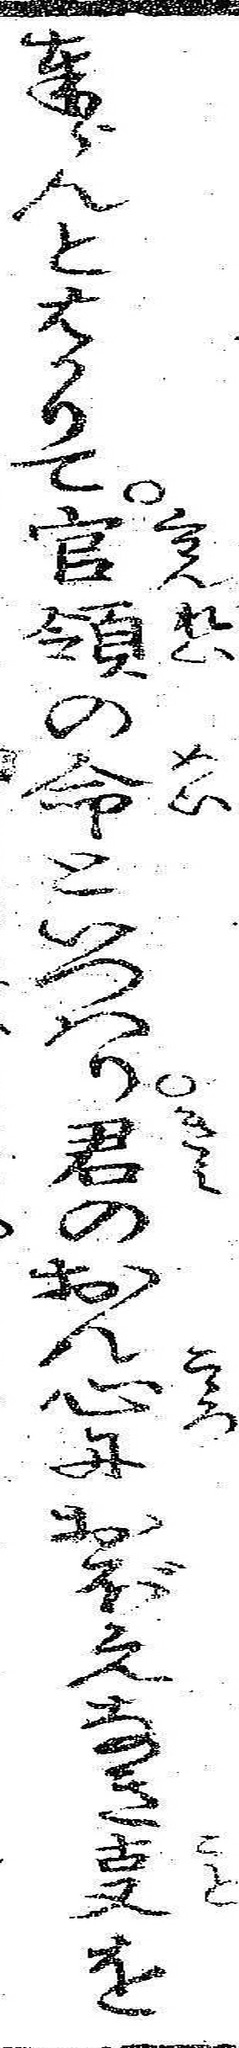奉らんとはかりて。官領の命といつはり。君のおん心におぼえなき事を
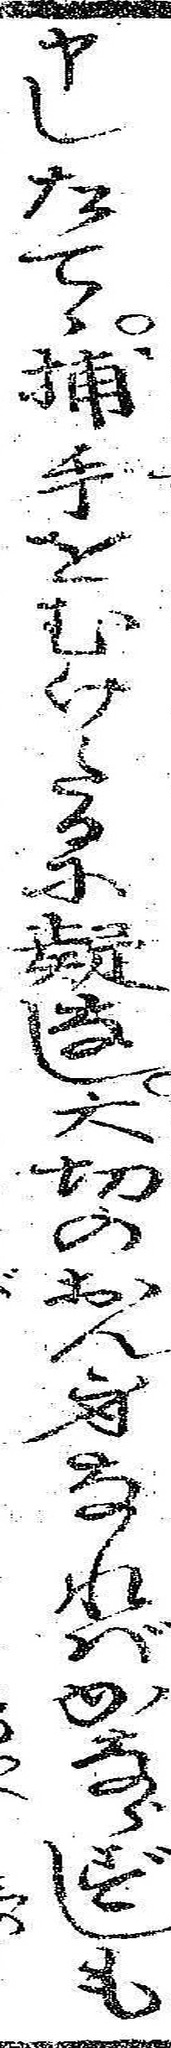申したてゝ。捕手をむけたるに疑なし。大切のおん身なればかならずしも
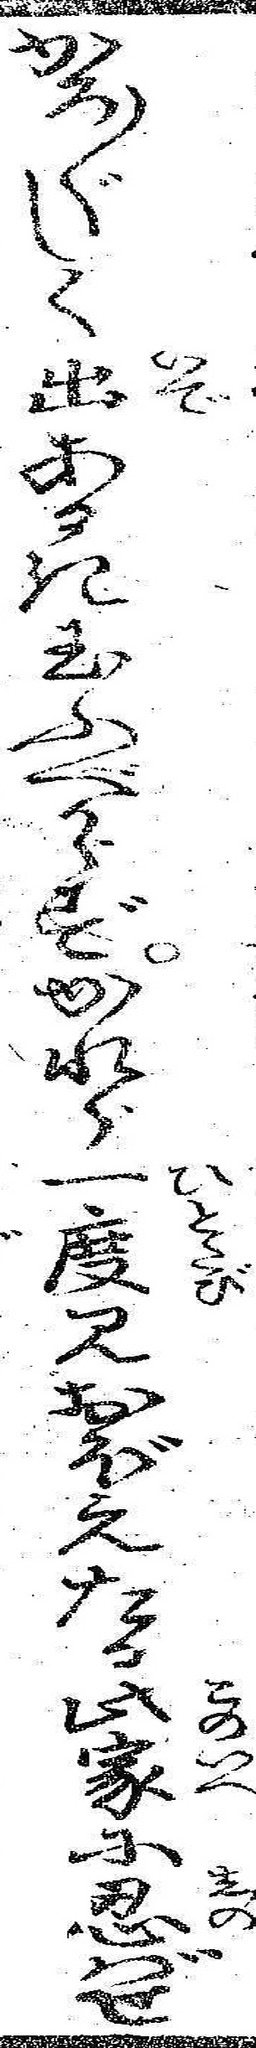かろ〴〵しく出あるき玉ふべからず。かれら一度見おぼえたる此家に忍ばせ
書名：昔話稲妻表紙
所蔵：国文学研究資料館
